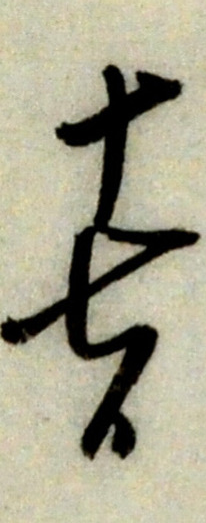十七日
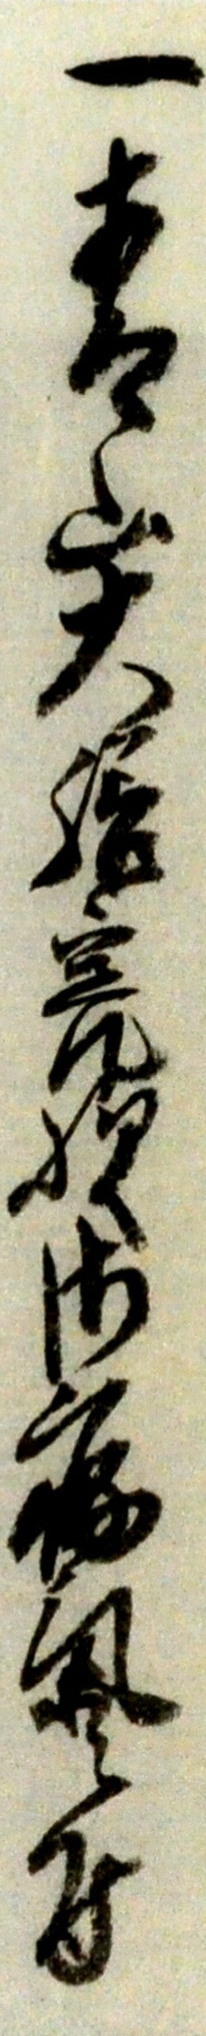一青山大膳亮様御病気に付
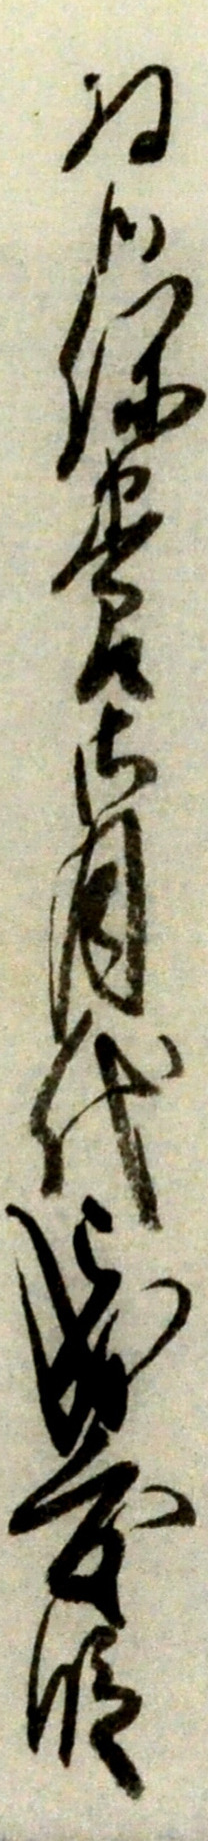為御保養御月代被成度段
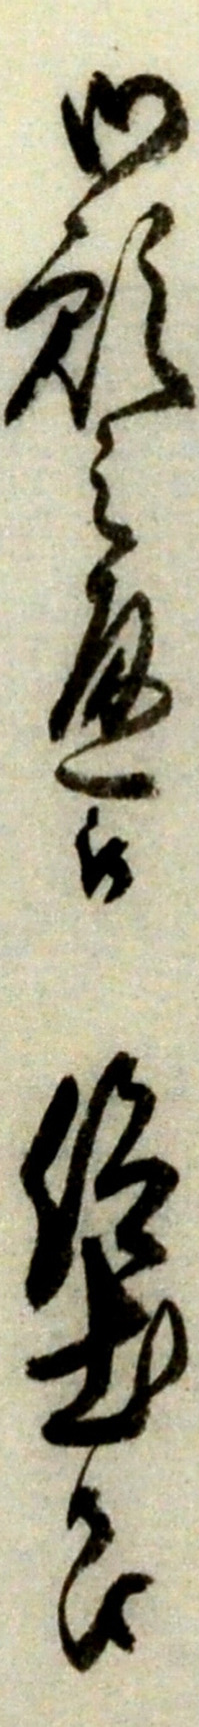御願之通被仰出候由
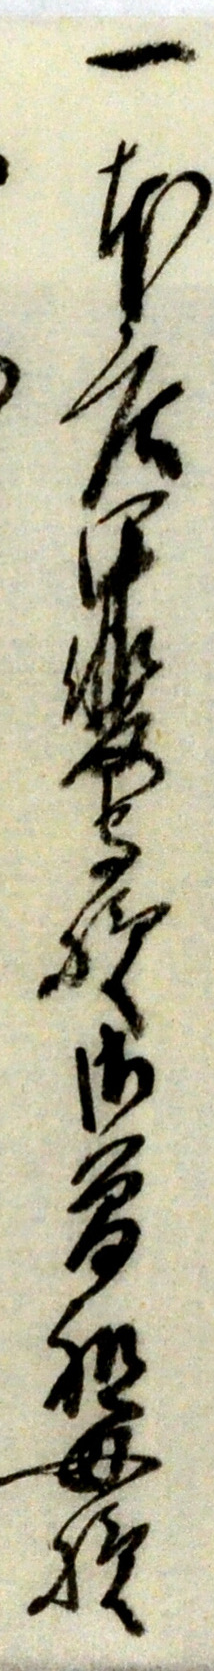一本庄甲斐守様御曽祖母様
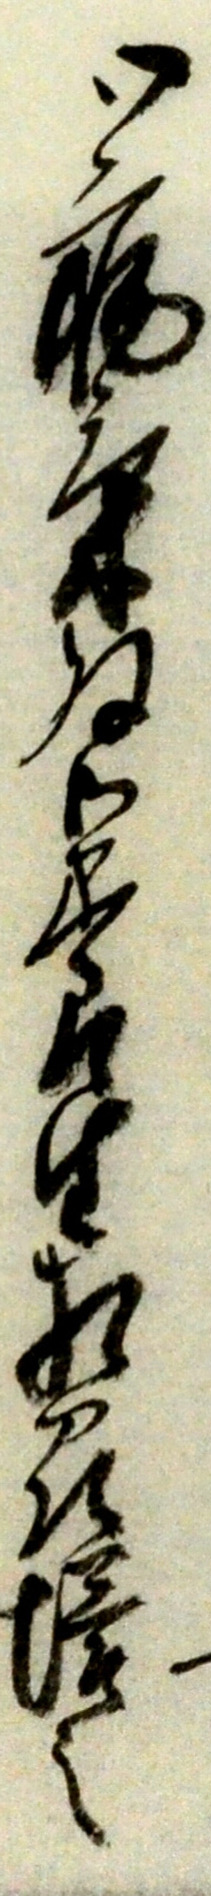御病気為御養生相州塔之
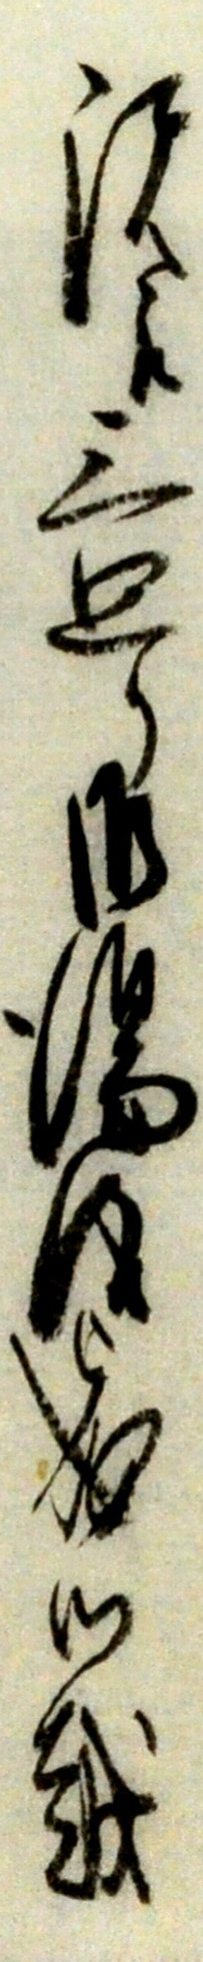沢え三廻り御湯治被成御越
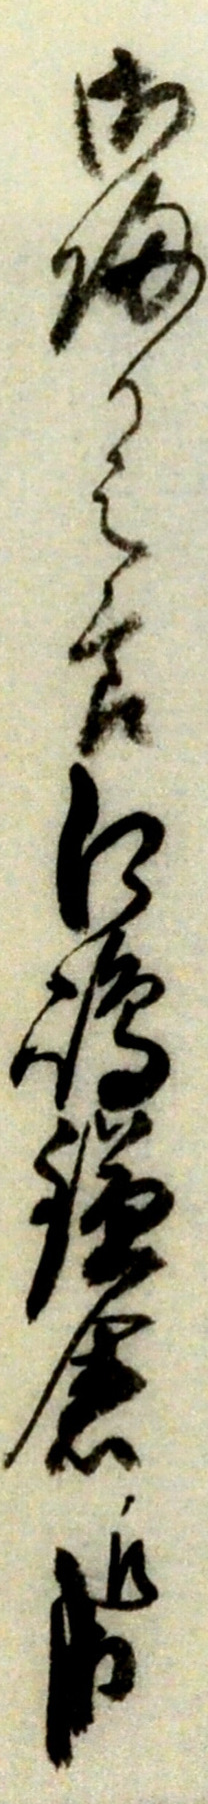御帰り之節江嶋鎌倉え御
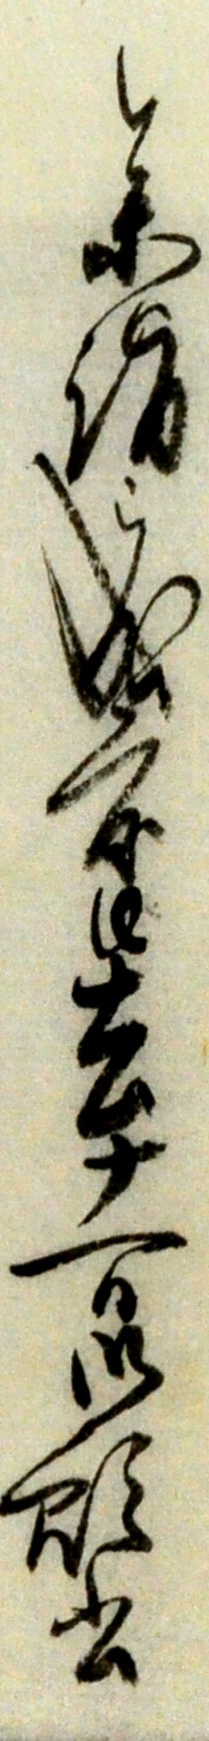参詣被成度由去十一日御願書
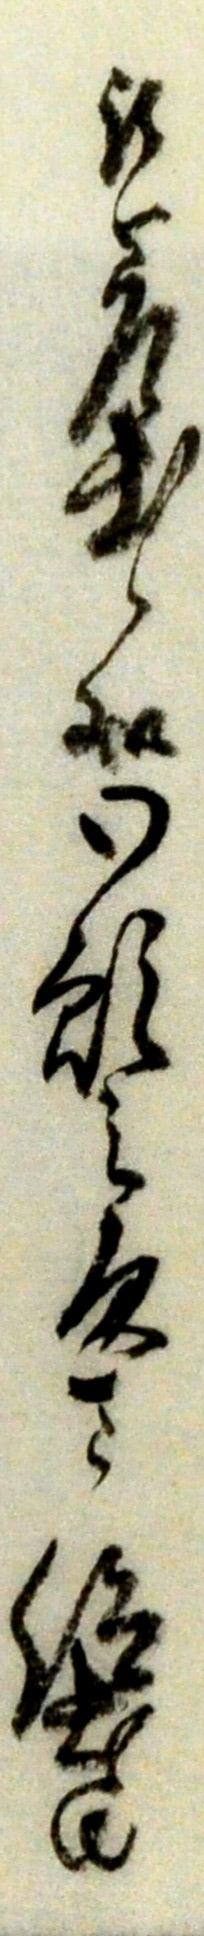被差出候処御願之通被仰出候由

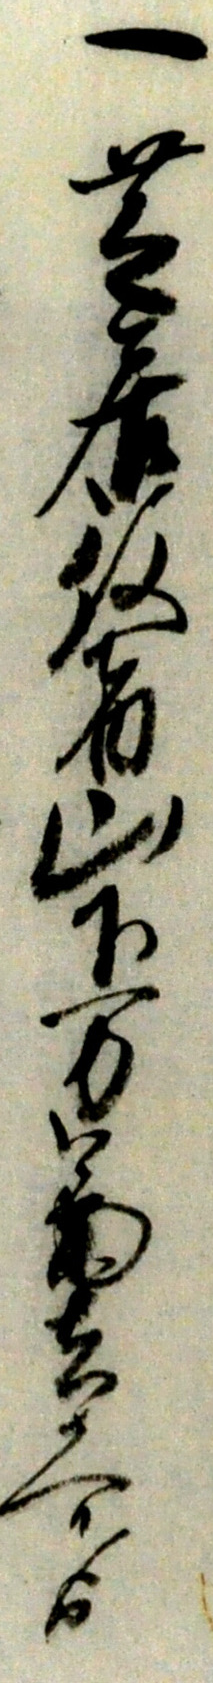一芝居役者山下万菊去二日ゟ
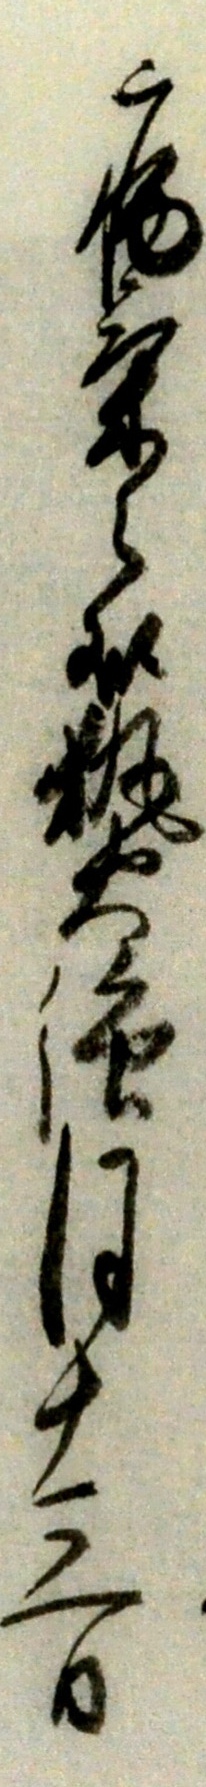病気之処熱強同十三日
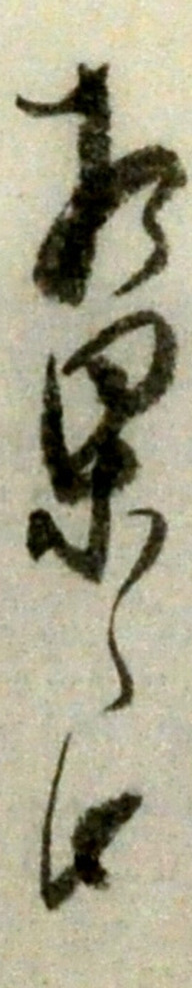相果候由
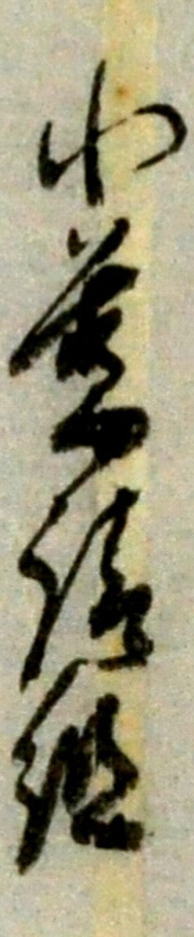小普請組
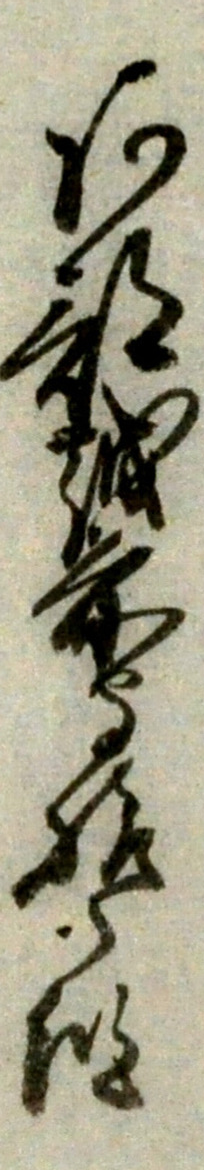阿部越前守様御組
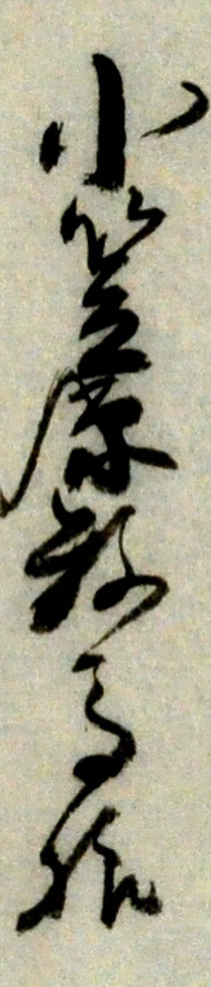小笠原数馬様
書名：申合帳〔一括〕
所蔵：伊那市立高遠町図書館・合同会社AMANE
